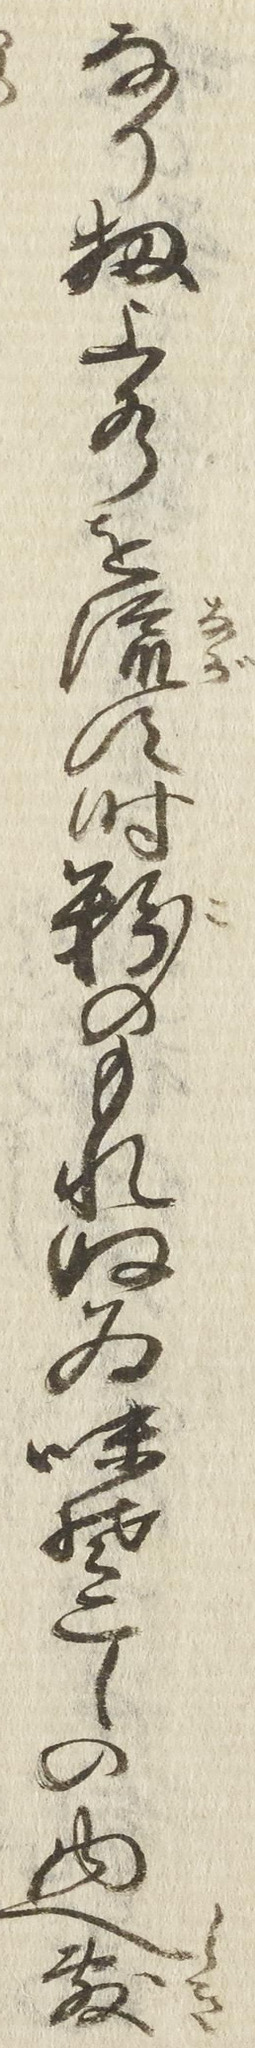なり扨上水を流す時粉のもれぬ為味そこしの内へ敷
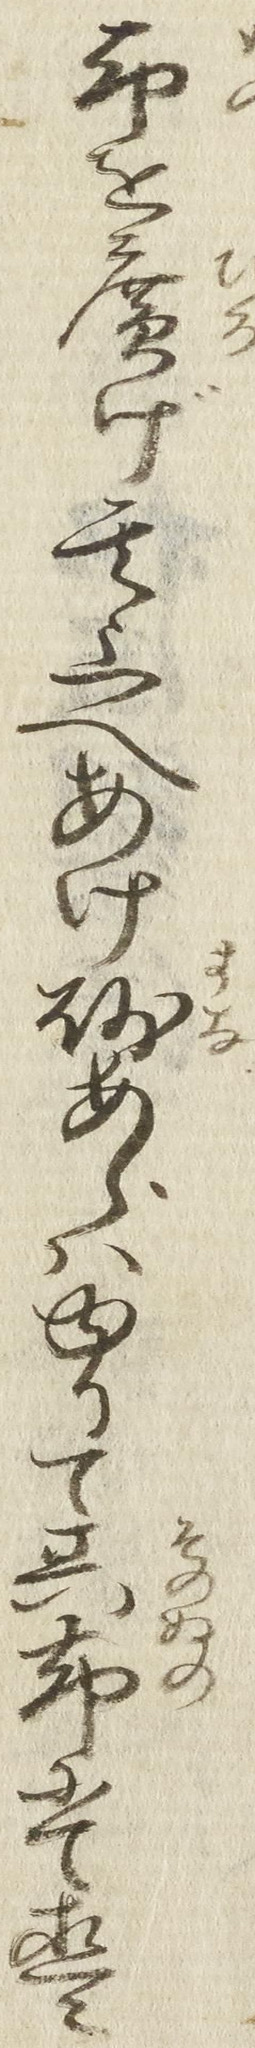布を広げて其上へあけ砂あらはゆりて其布にて直ニ
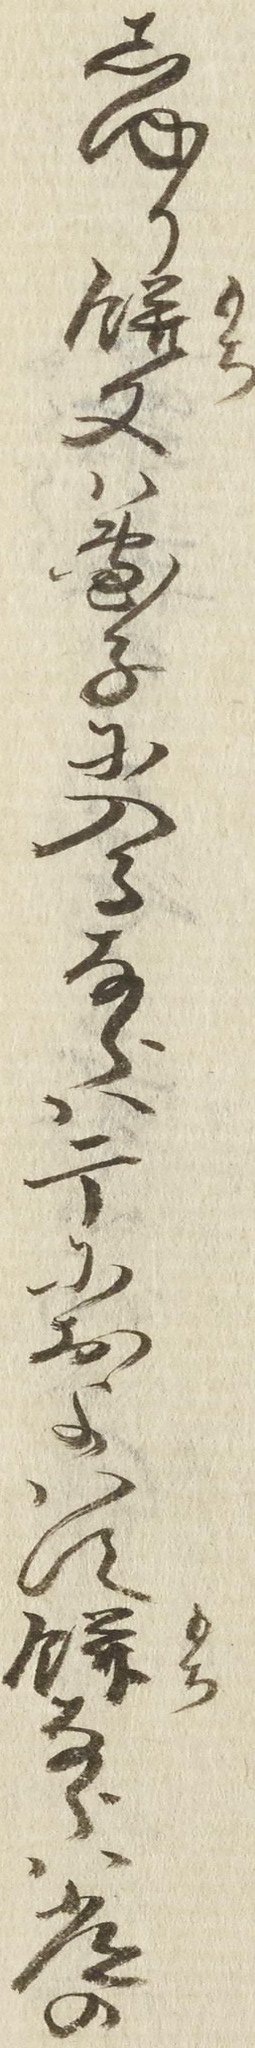しほり餅又は団子に入るならは干におよはす餅ならは常の
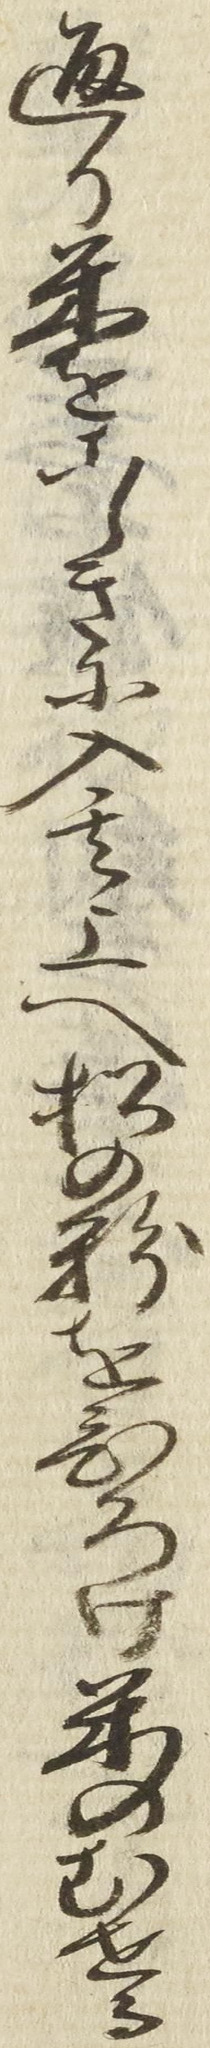通り米をこしきに入其上へ松の粉をひろけ米のむせる
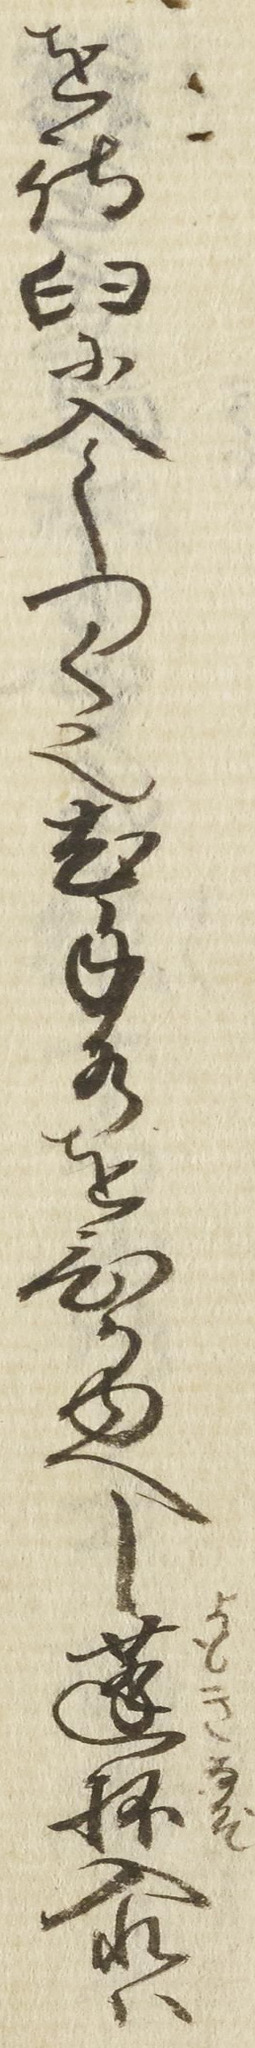を待臼に入てつく也尤手水をひかゆへし蓬抔入れは
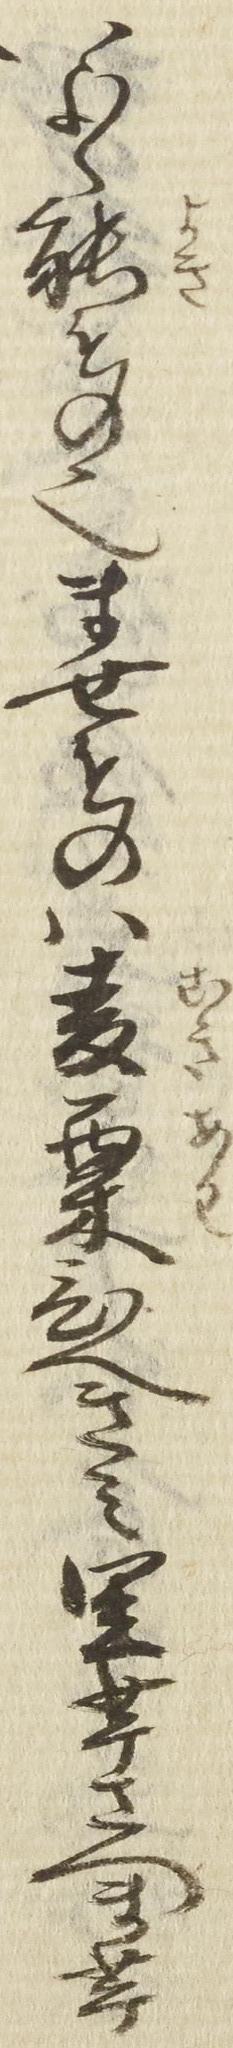いよ〳〵能もの也ませものは麦粟ひへきみ里芋さつま芋
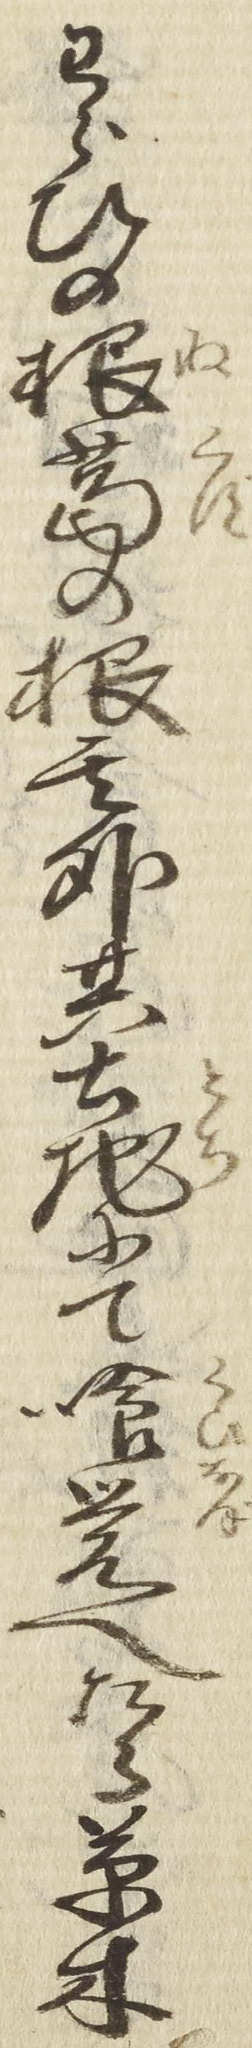わらひの根葛の根其外其土地にて喰覚へたる草木
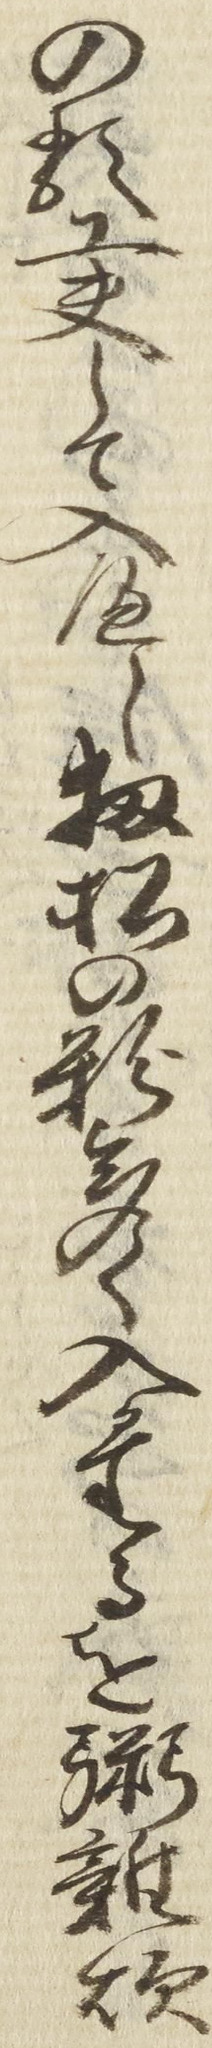の類工夫して入へし扨松の粉多く入たるを粥雑炊
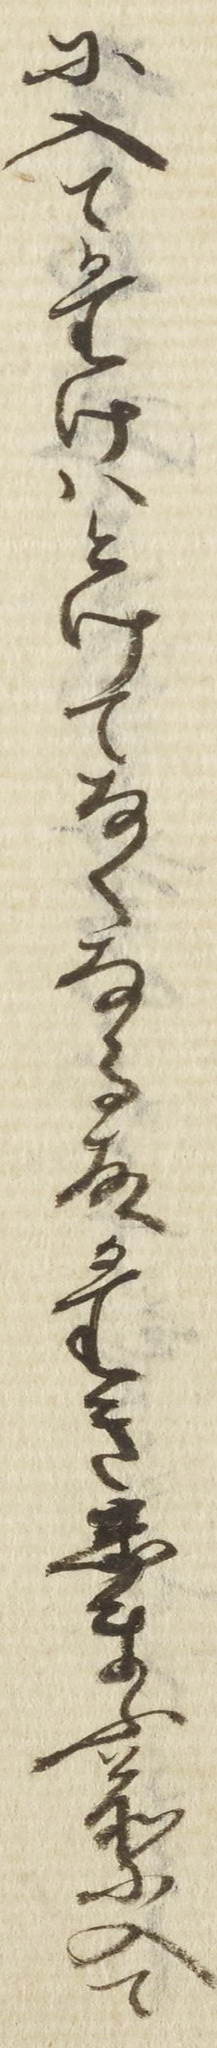に入てたけはとけてなくなる故たきしまふ前に入て
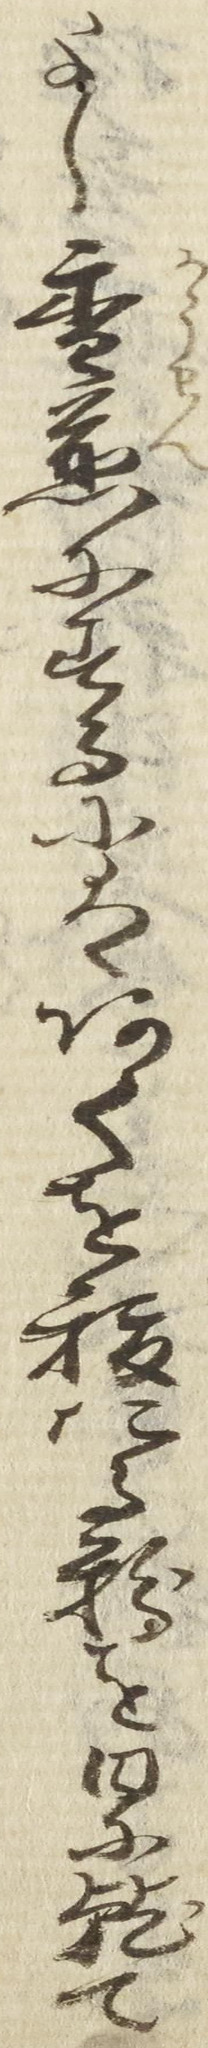よし香煎にするにはあくを抜たる粉を日に乾て
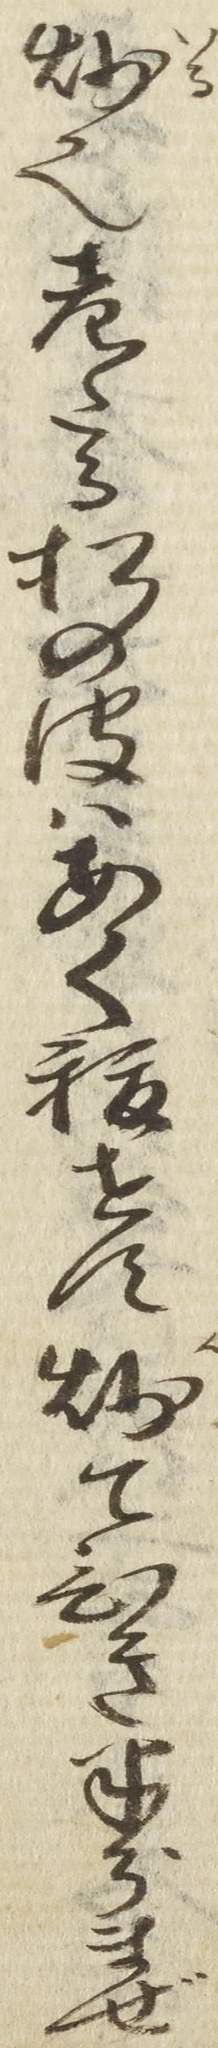炒也老たる松の皮はあく抜せす炒てひき半分まぜ

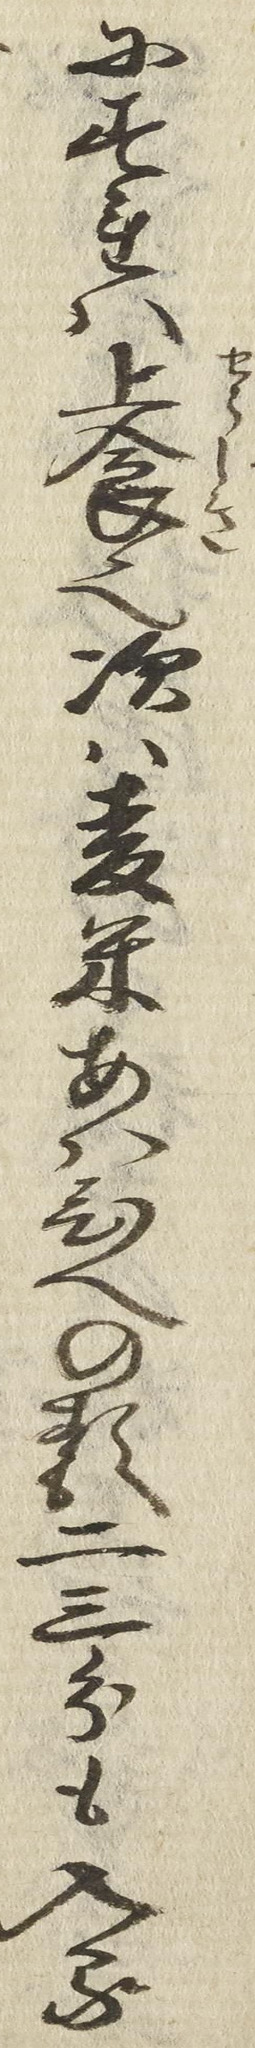にすれは上食也次は麦米あはひへの類ニ三分も入る
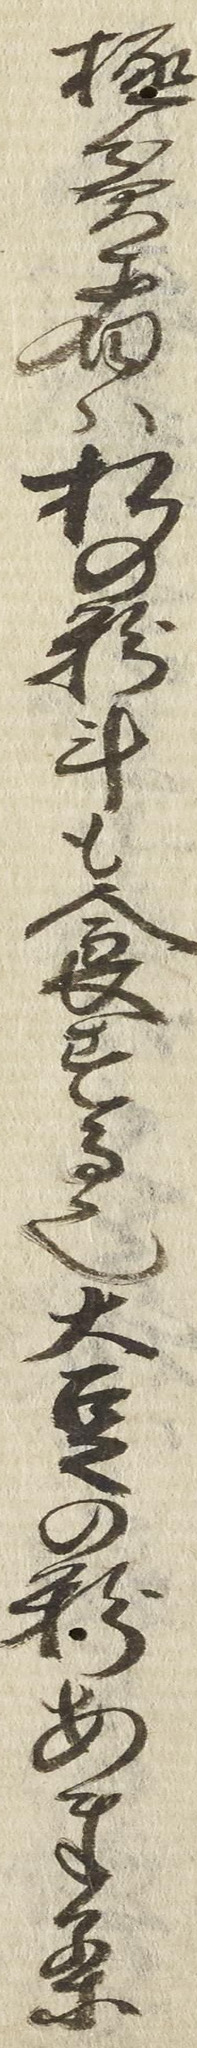極貧者は松の粉斗も食する也大豆の粉あま茶
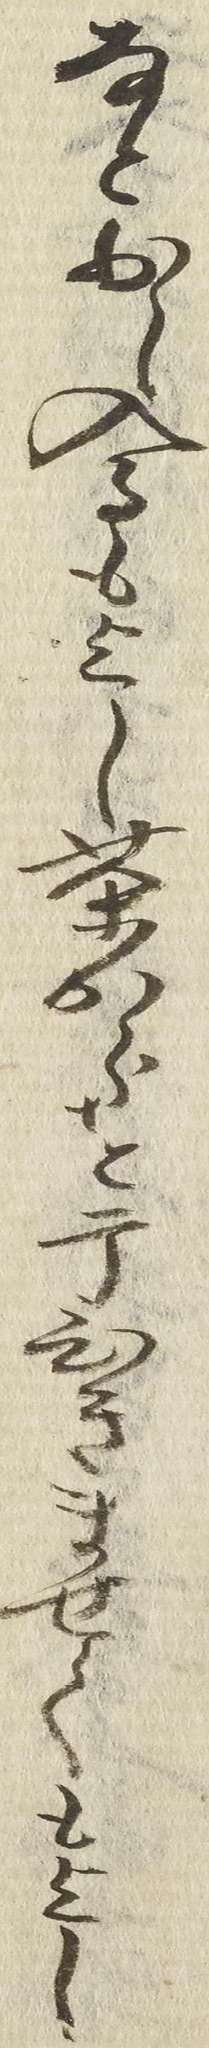なと少し入るもよし茶からを干ひきませてもよし
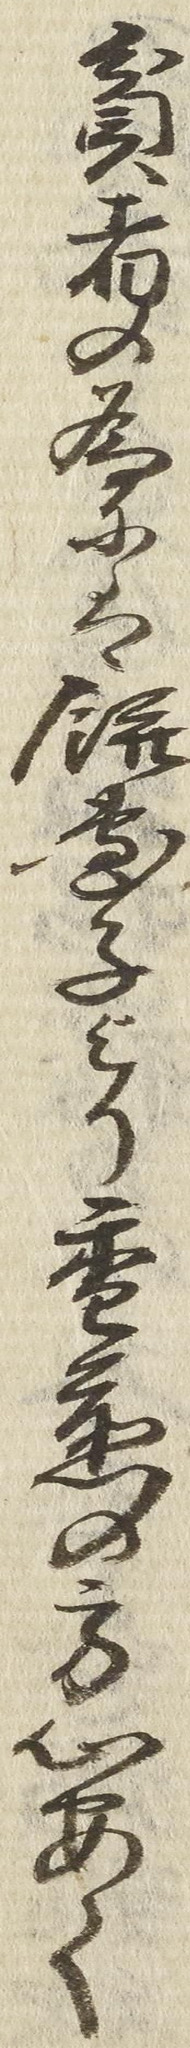貧者の為には餅団子より香煎の方心安く
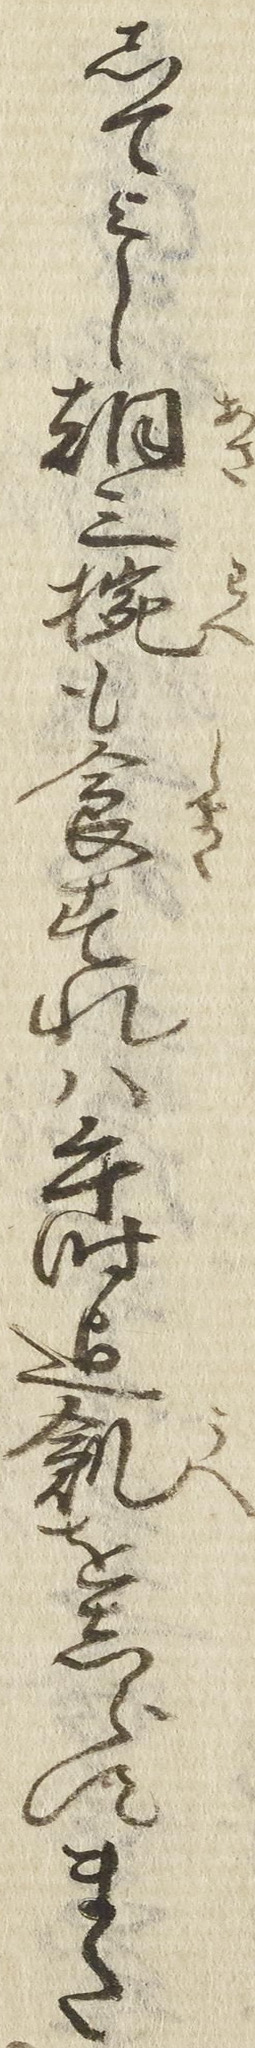してよし朝三椀も食すれは午時迄飢をしらすまた
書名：天明奇畧　全
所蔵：東京大学地震研究所図書室 Earthquake Research Institute Library, The University of Tokyo, JAPAN
